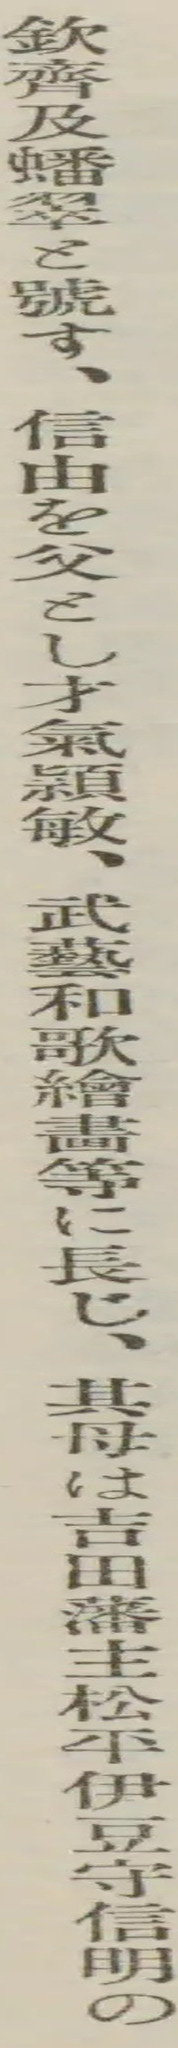欽齊及蟠翠と号す、信由を父とし才気頴敏、武芸和歌絵画等に長じ、其母は吉田藩主松平伊豆守信明の
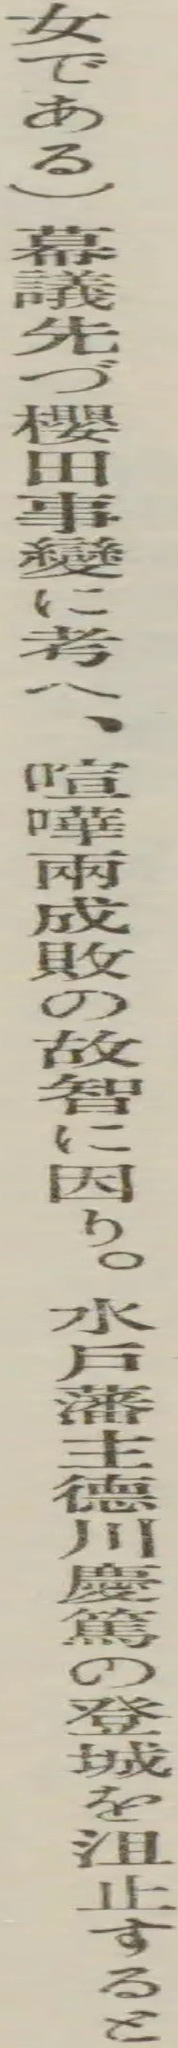女である)幕議先づ桜田事変に考へ、喧嘩両成敗の故智に因り。水戸藩主徳川慶篤の登城を沮止すると
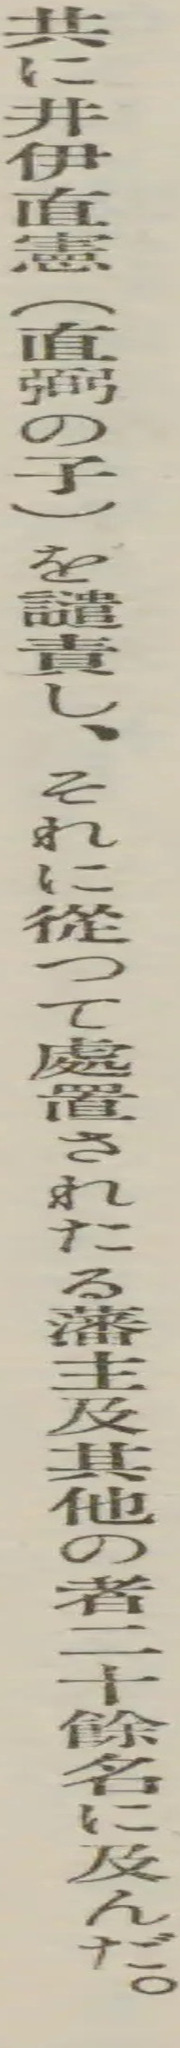共に井伊直憲(直弼の子)を譴責し、それに従つて処置されたる藩主及其他の者二十余名に及んだ。
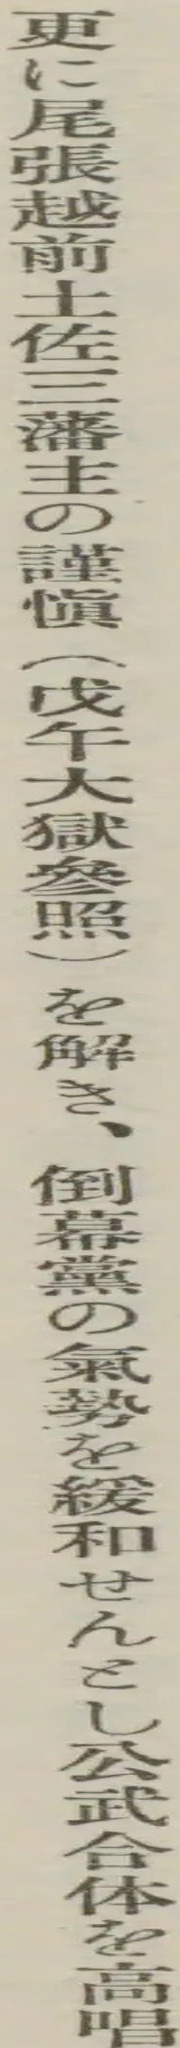更に尾張越前土佐三藩主の謹慎(戊午大獄参照)を解き、倒幕党の気勢を緩和せんとし公武合体を高唱
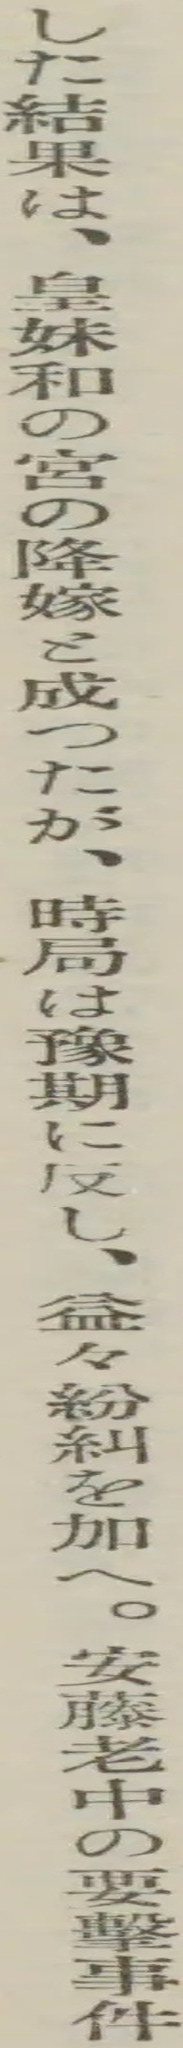した結果は、皇妹和の宮の降嫁と成つたが、時局は予期に反し、益々紛糾を加へ。安藤老中の要撃事件
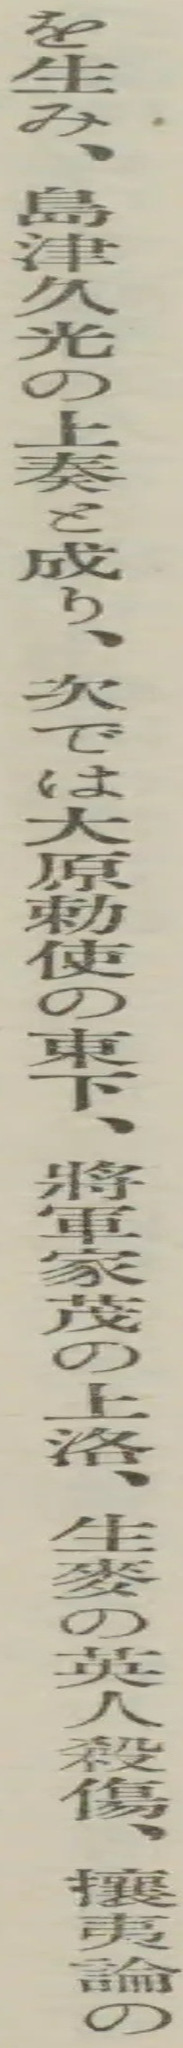を生み、島津久光の上奏と成り、次では大原勅使の東下、将軍家茂の上洛、生麦の英人殺傷、攘夷論の
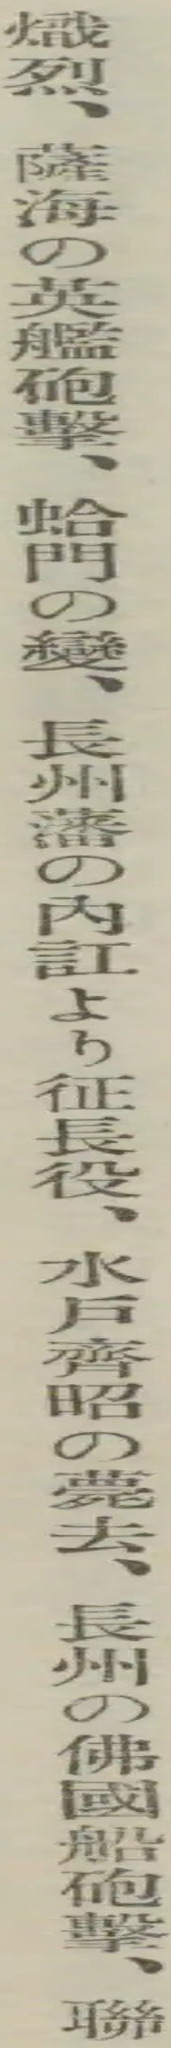熾烈、薩海の英艦砲撃、蛤門の変、長州藩の内訌より征長役、水戸齊昭の薨去、長州の仏国船砲撃、聯
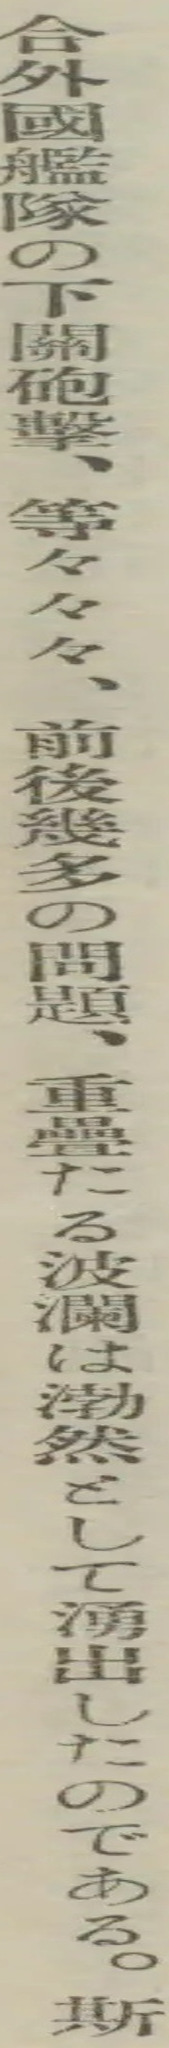合外国艦隊の下関砲撃、等々々々、前後幾多の問題、重畳たる波瀾は渤然としれ湧出したのである。斯
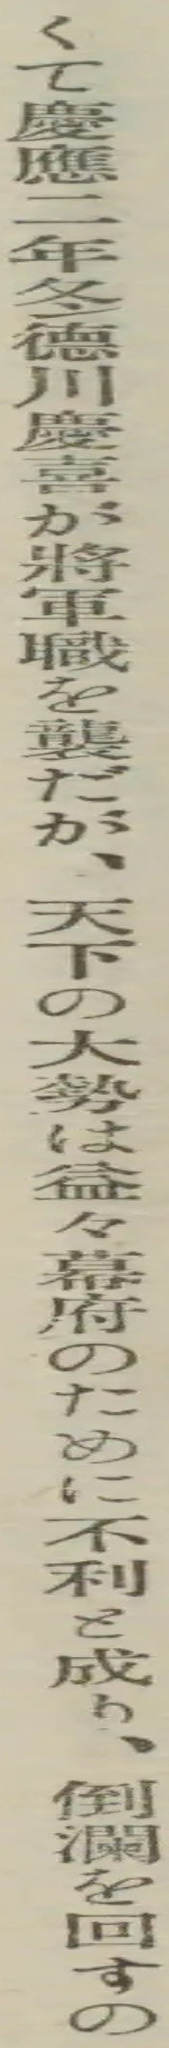くて慶応二年冬徳川慶喜が将軍職を襲だが、天下の大勢は益々幕府のために不利と成り、倒瀾を回すの
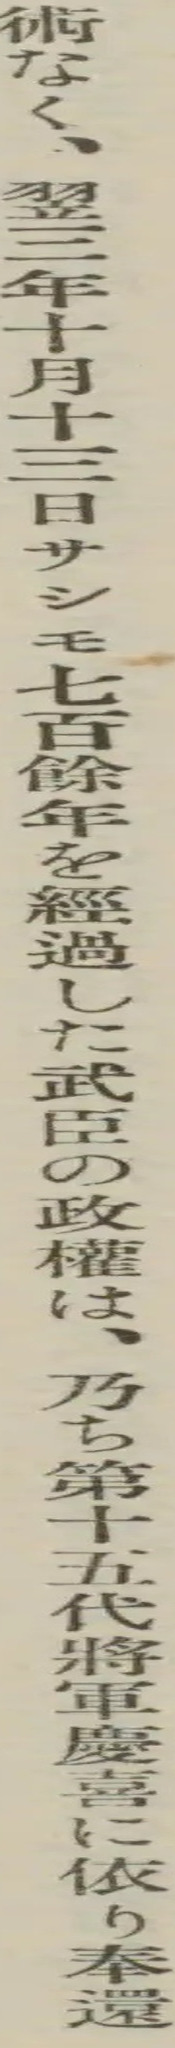術なく、翌三年十月十三日サシモ七百余年を経過した武臣の政権は、乃ち第十五代将軍慶喜に依り奉還
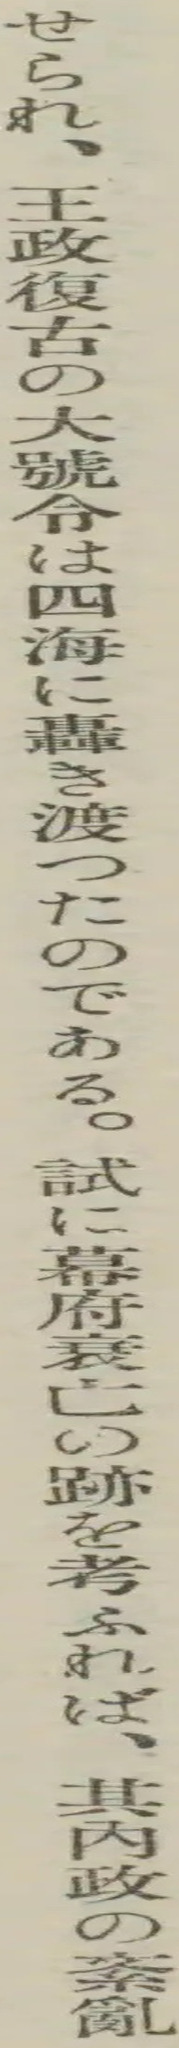せられ、王政復古の大号令は四海に轟き渡つたのである。誠に幕府衰亡の跡を考ふれば、其内政の紊乱
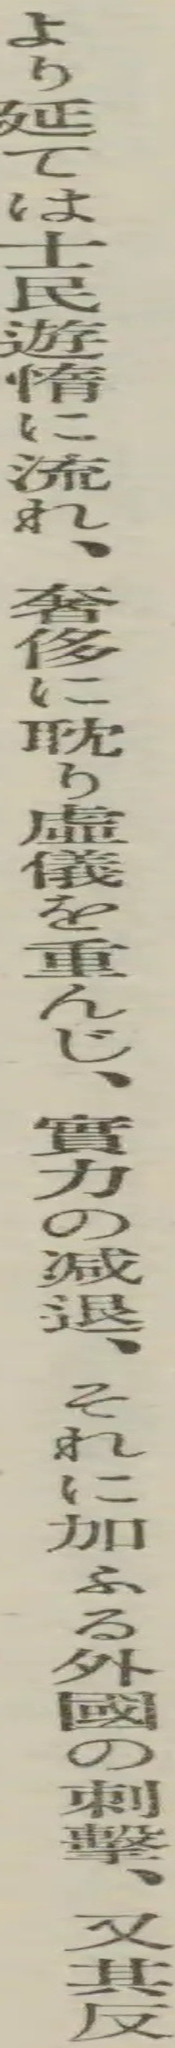より延ては士民遊惰に流れ、奢侈に耽り虚偽を重んじ、実力の減退、それに加ふる外国の刺撃、又其反
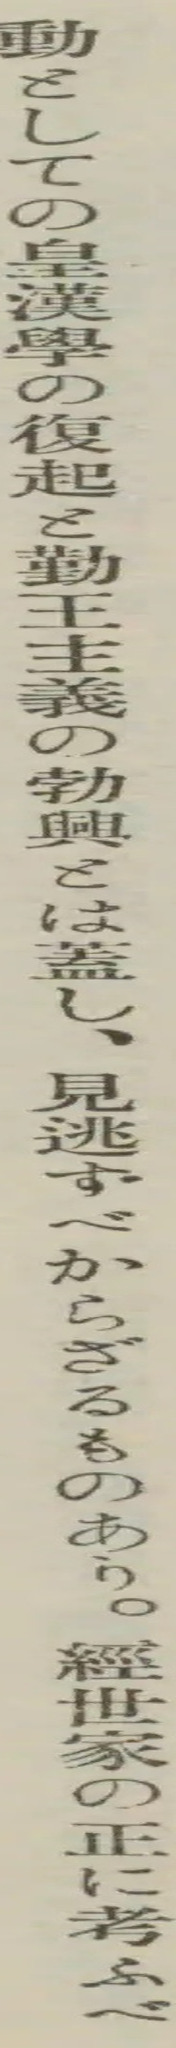動としての皇漢学の復起と勤王主義の勃興とは蓋し、見逃すべからざるものあり。経世家の正に考ふべ
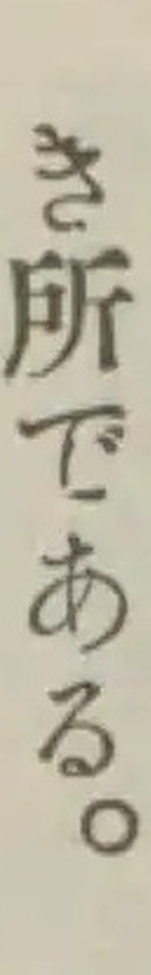き所である。
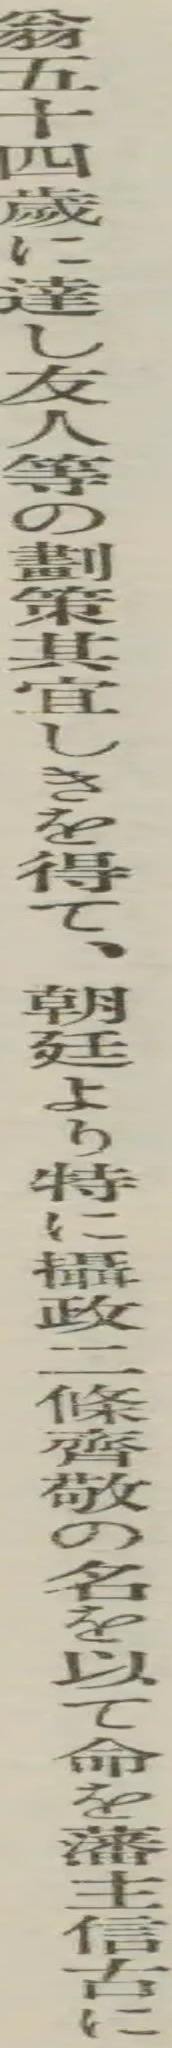翁五十四歳に達し友人等の劃策其宜しきを得て、朝廷より特に摂政二條齊敬の名を以て命を藩主信古に
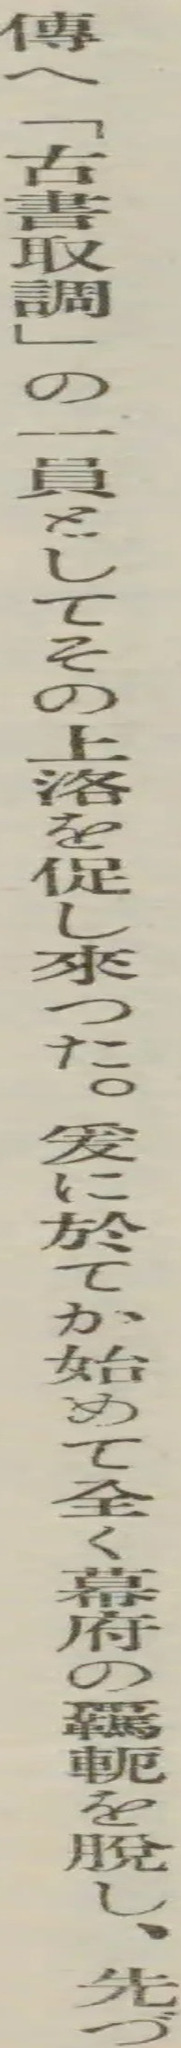伝へ「古書取調」の一員としてその上洛を促し来つた。爰に於てか始めて全く幕府の覊軛を脱し、先づ
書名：小野湖山翁小伝
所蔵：国立国会図書館 National Diet Library, JAPAN
